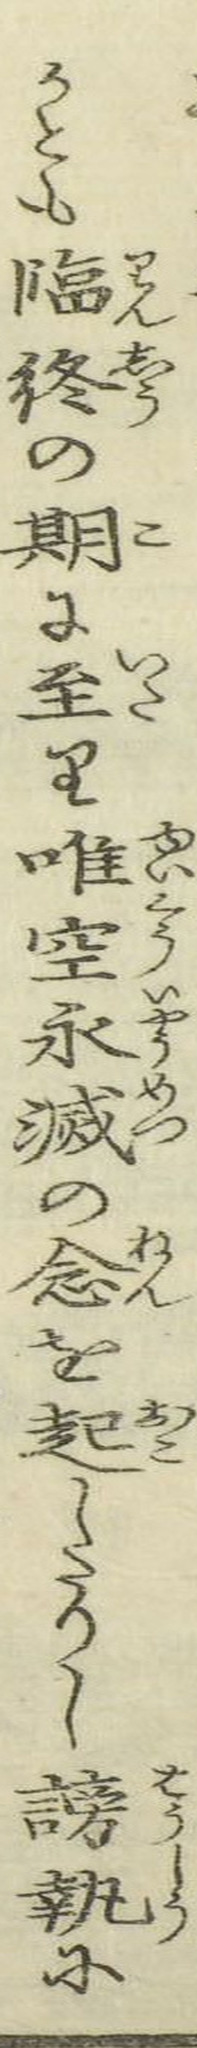かとも臨終の期に至り唯空永滅の念を起したりし謗執に
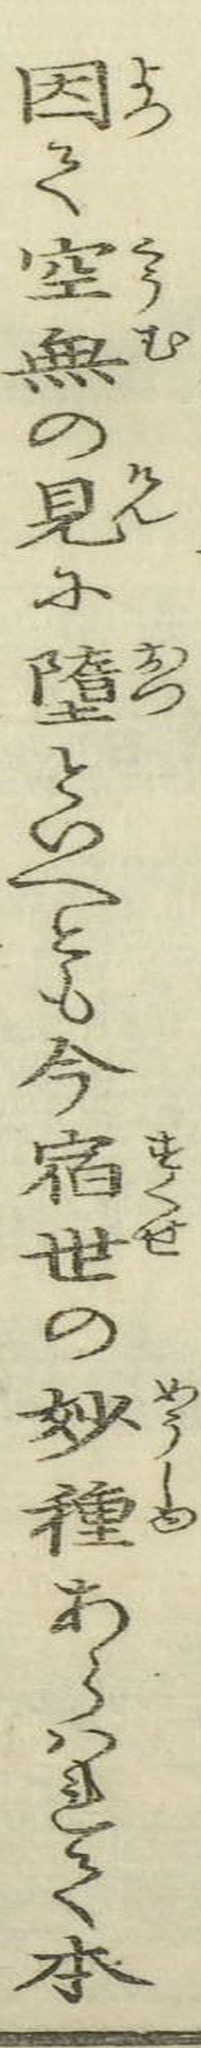因て空無の見に墮といへとも今宿世の妙種あらはれて本
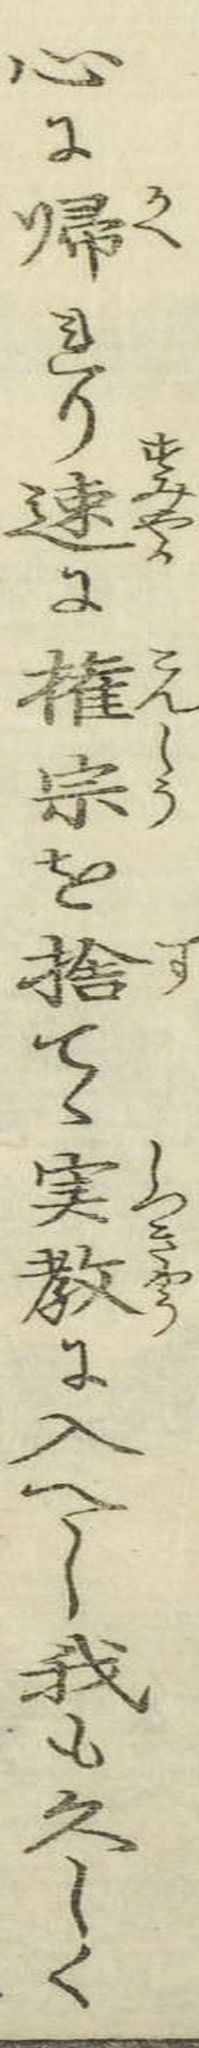心に帰れり速に権宗を捨てゝ実教に入へし我も久しく
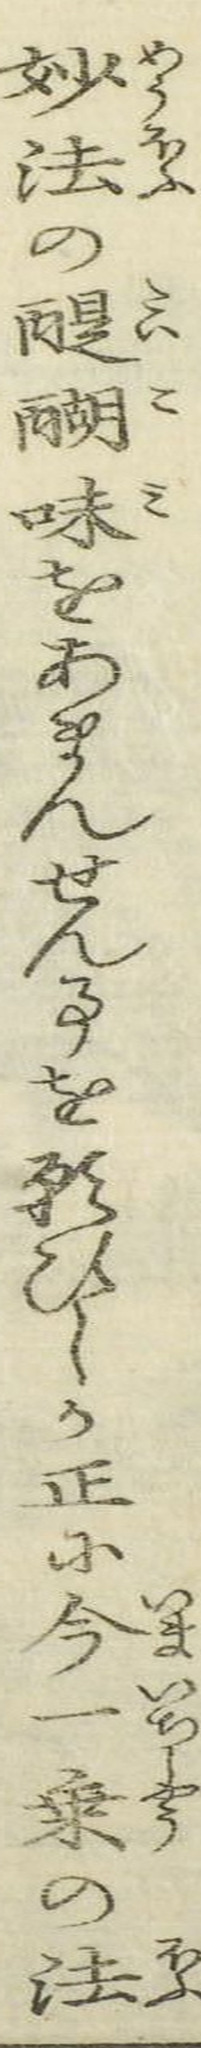妙法の醍醐味をあまんせん事を願ひしか正に今一乗の法
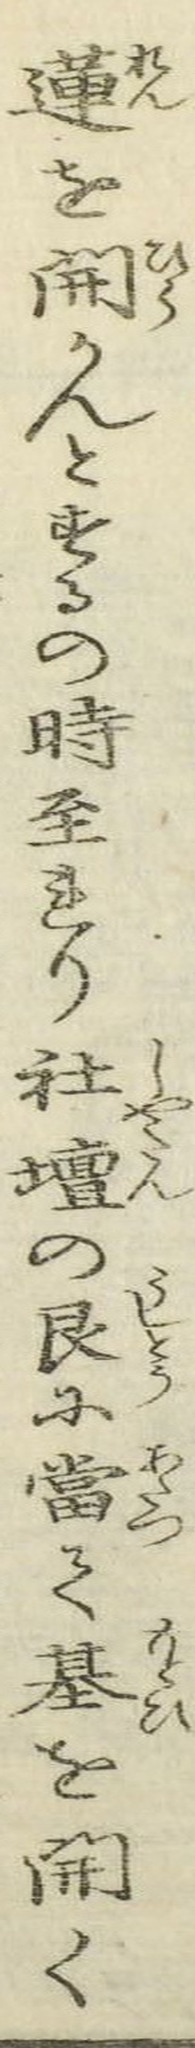蓮を開かんとするの時至れり社壇の艮に當て基を開く
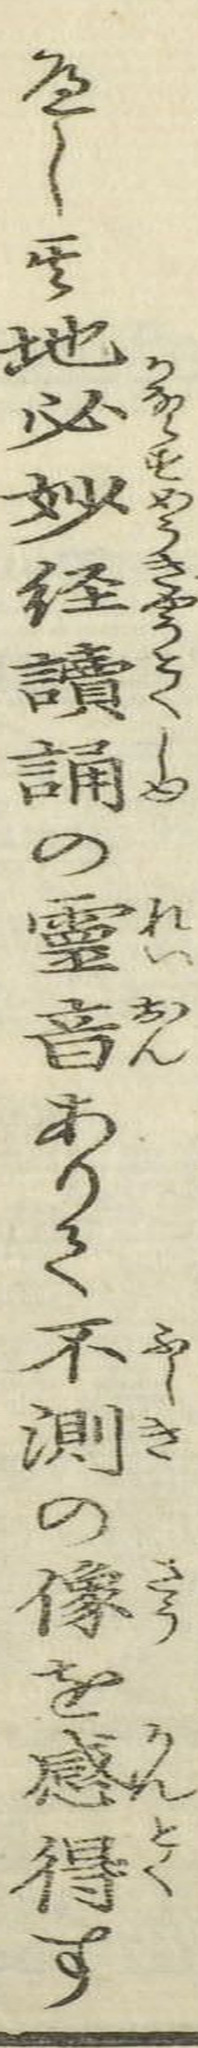へし其地必妙経讀誦の霊音ありて不測の像を感得す
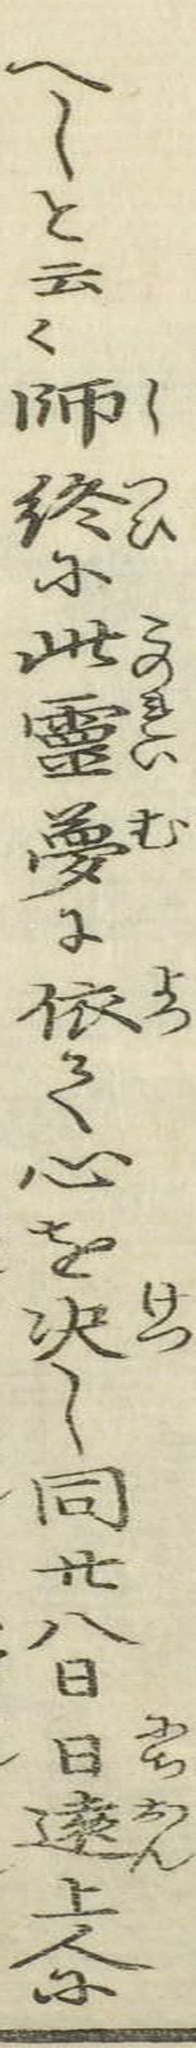へしと云々師終に此霊夢に依て心を決し同廿八日日遠上人に
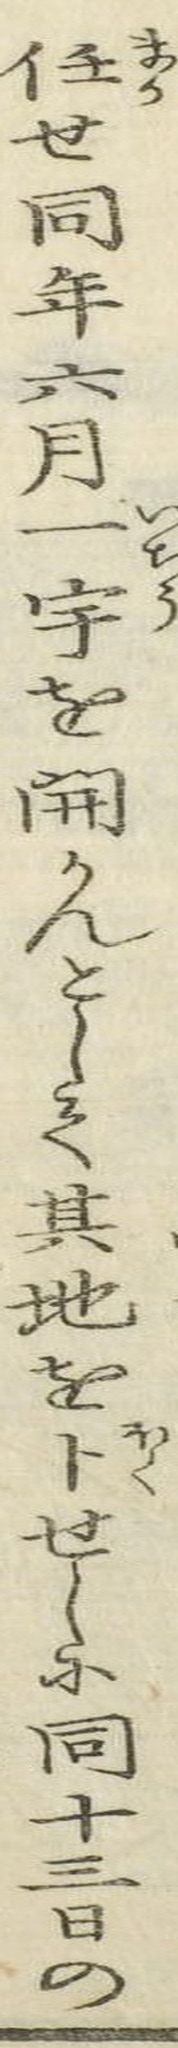任せ同年六月一宇を開かんとして其地を卜せしに同十三日の
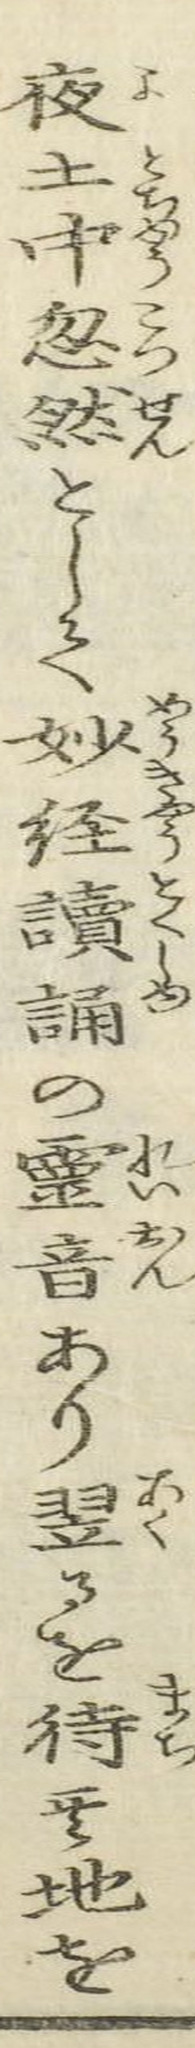夜土中忽然として妙経讀誦の霊音あり翌るを待其地を
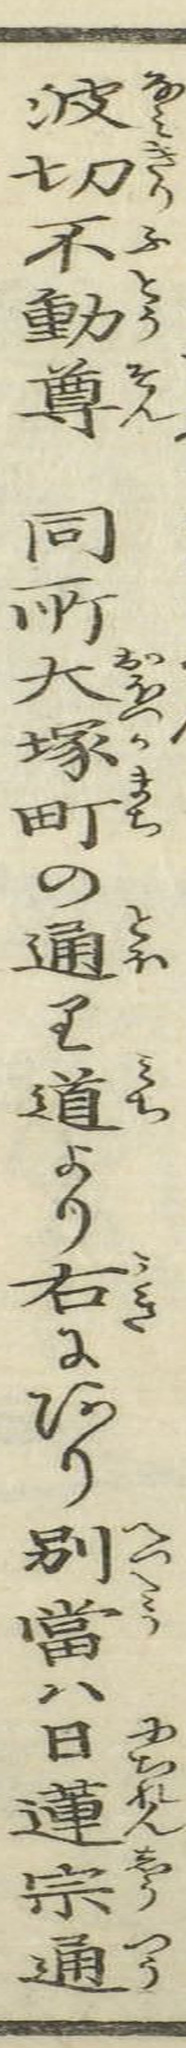波切不動尊同所大塚町の通り道より右にあり別當は日蓮宗通
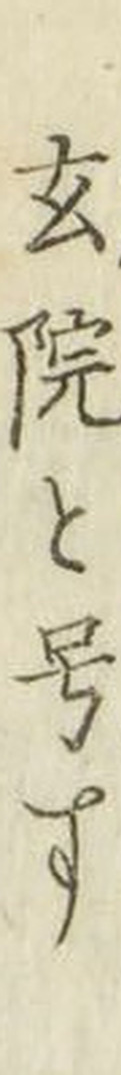玄院と号す
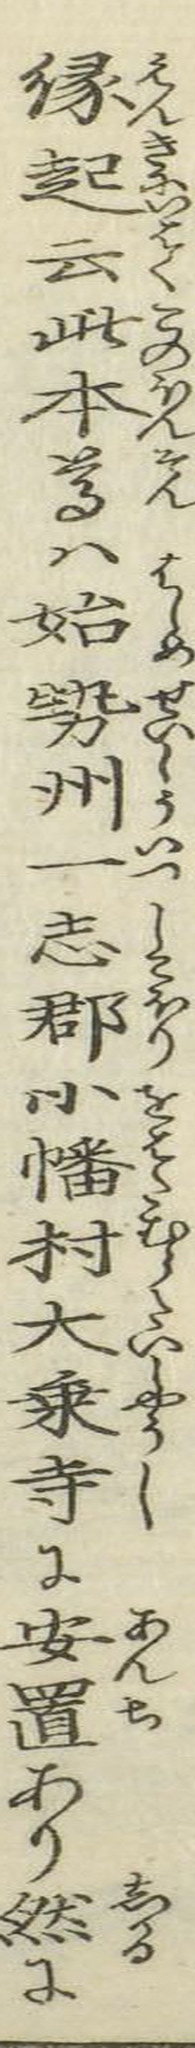縁起云此本尊は始勢州一志郡小幡村大乗寺に安置あり然に
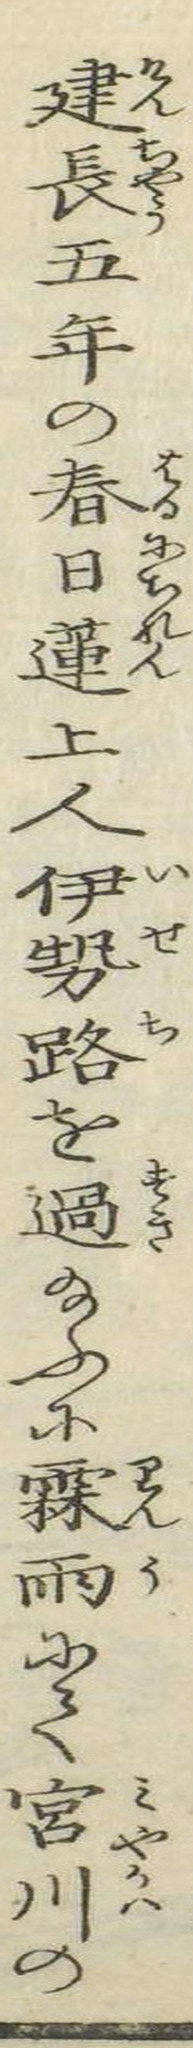建長五年の春日蓮上人伊勢路を過給ふに霖雨にて宮川の
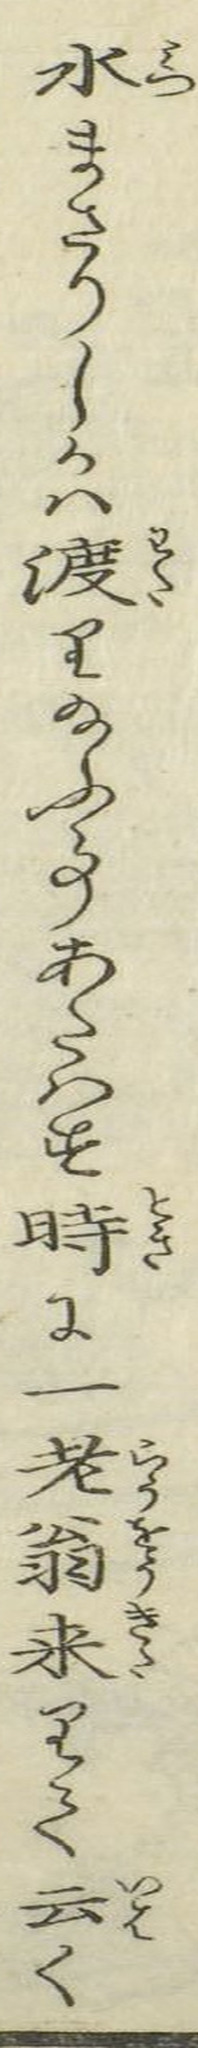水まさりしかは渡り給ふ事あたはす時に一老翁来りて云く
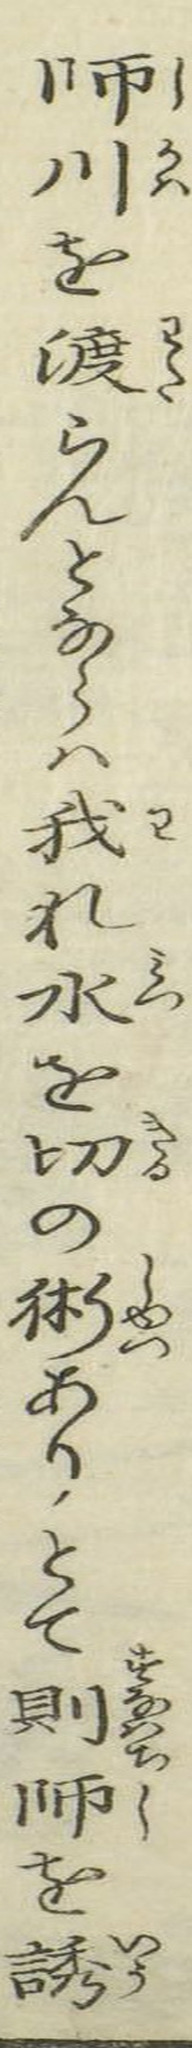師川を渡らんとならは我れ水を切の術ありとて則師を誘
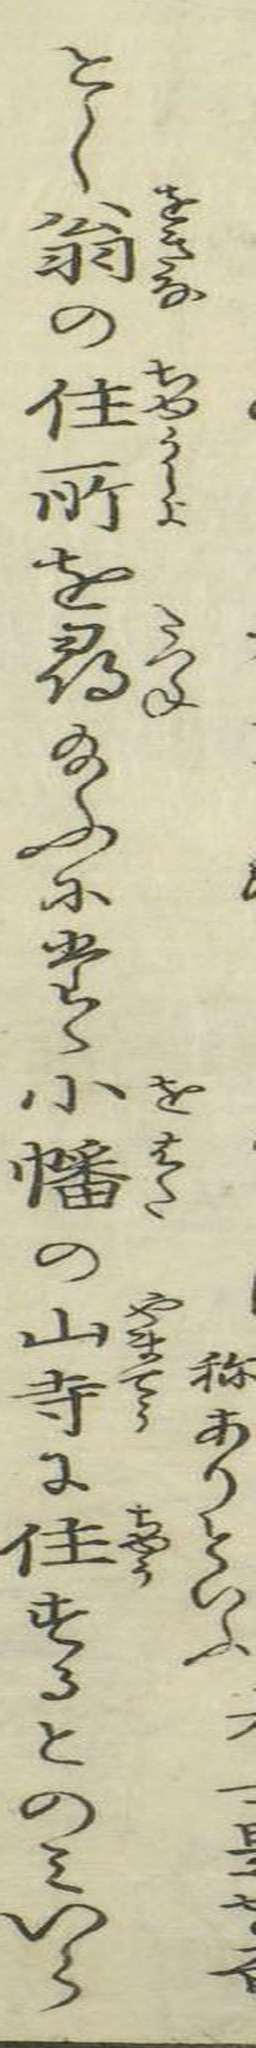とし翁の住所を尋給ふにたゝ小幡の山寺に住するとのみいう
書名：江戸名所図会 20巻 巻之12
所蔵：東京学芸大学教育コンテンツアーカイブ
